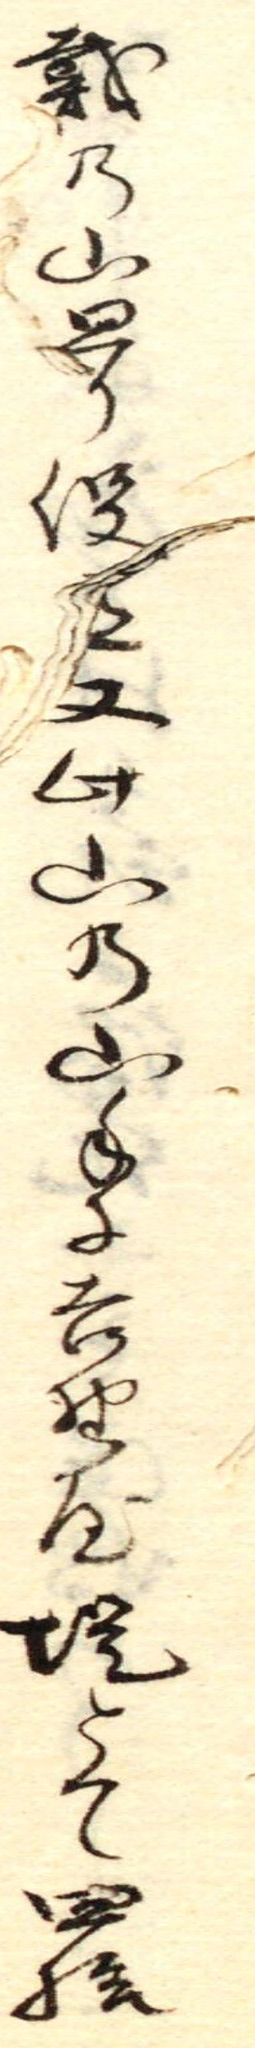戴の山廻り役有又此山の山手に吉野屋堤とて四拾
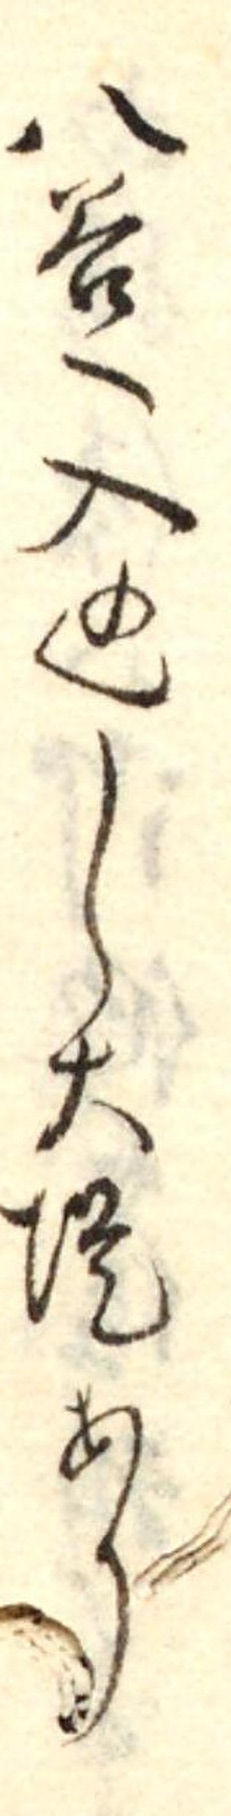八谷へ入込し大堤あり
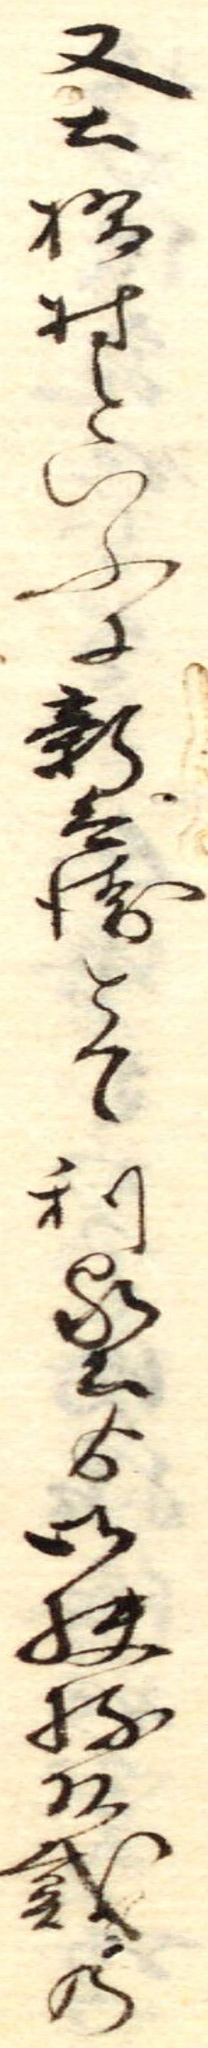又土橋村といふに新兵衛とて利家公ゟ御扶持頂戴の
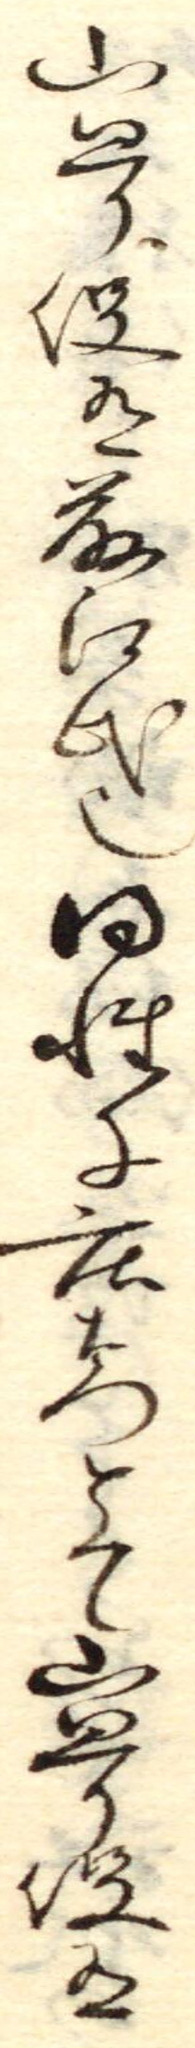山廻り役有藤江氏也同性に庄右衛門とて山廻り役有
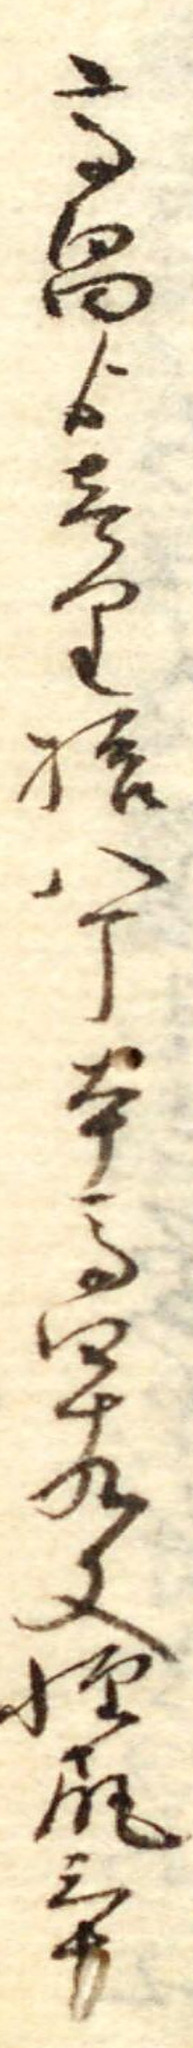高畠ゟ壱里拾八丁本馬四十九文軽尻三十
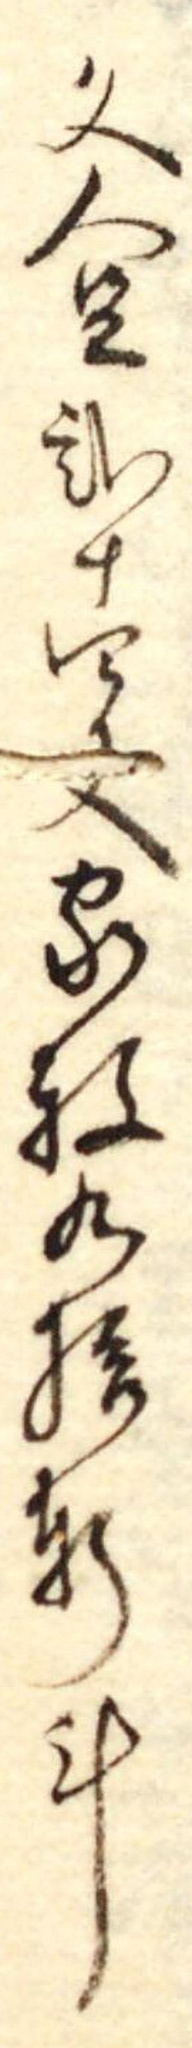文人足弐十四文家数九拾軒計
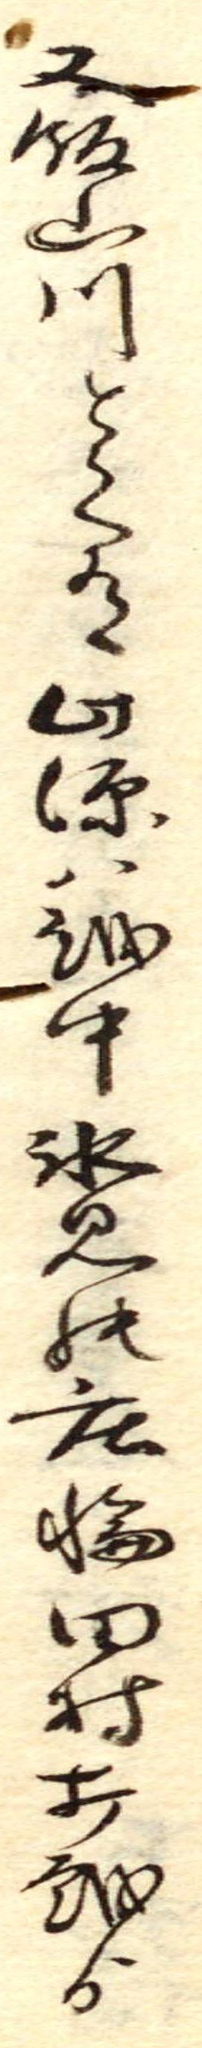又飯山川とて有此源は越中氷見の庄輪田村打越ゟ
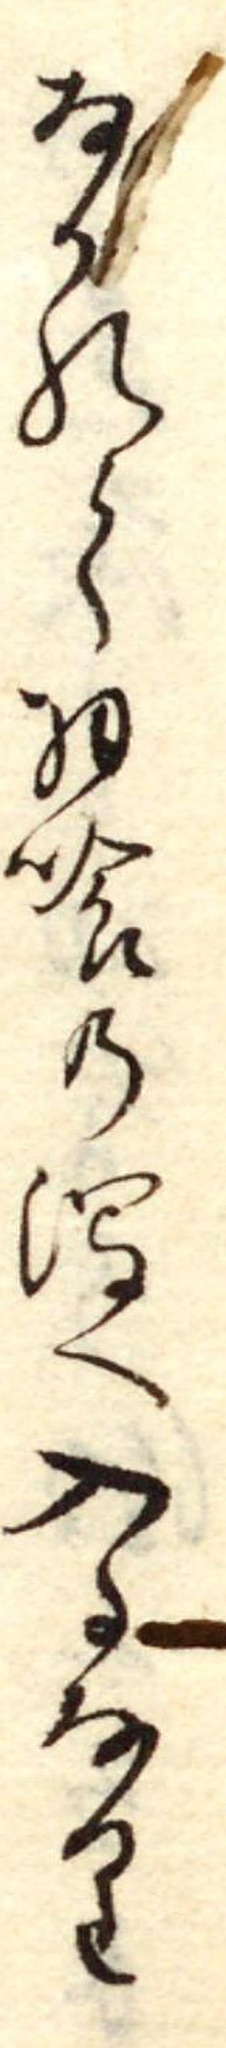なかれて羽喰の潟へ入るなり
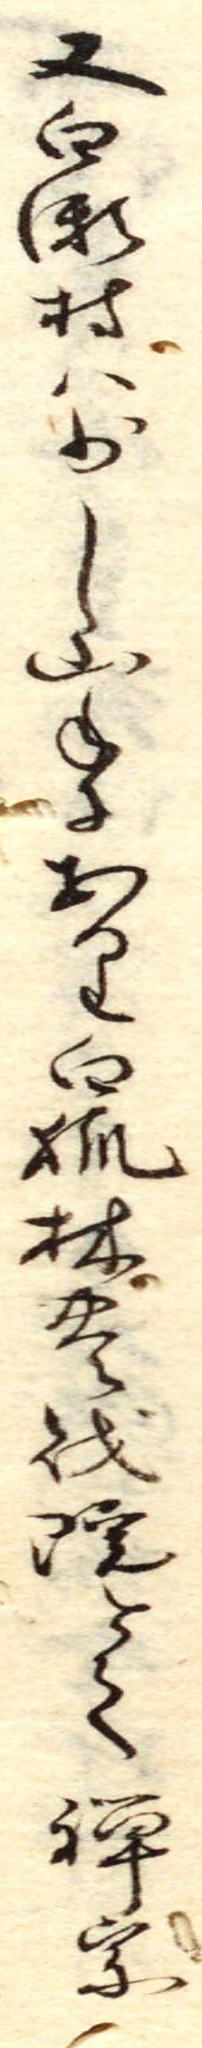又白瀬村は少し山手にあり白狐林豊財院とて禅宗
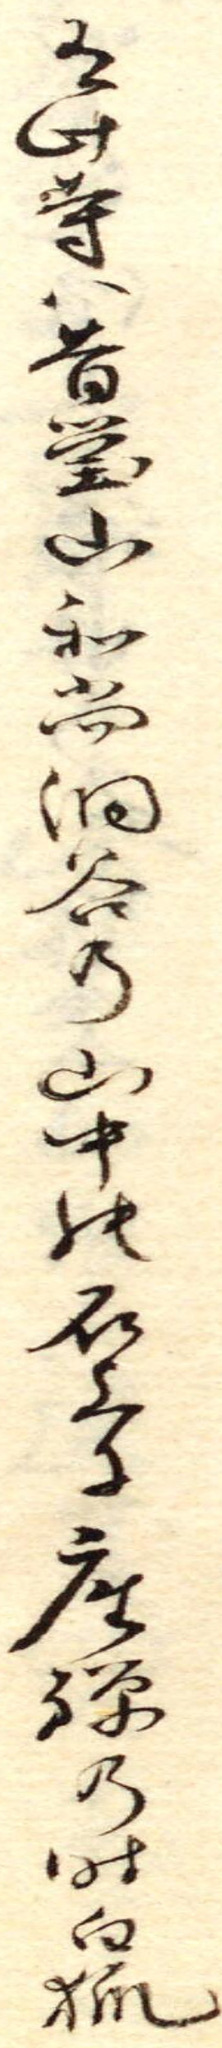有此寺は昔瑩山和尚洞谷の山中の石上に座禅の時白狐
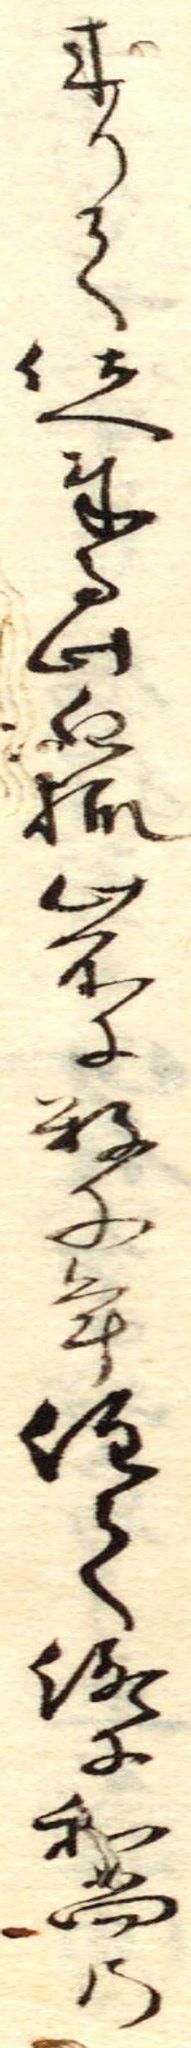来りて仕へ奉る此白狐此所に数千年住て終に和尚の
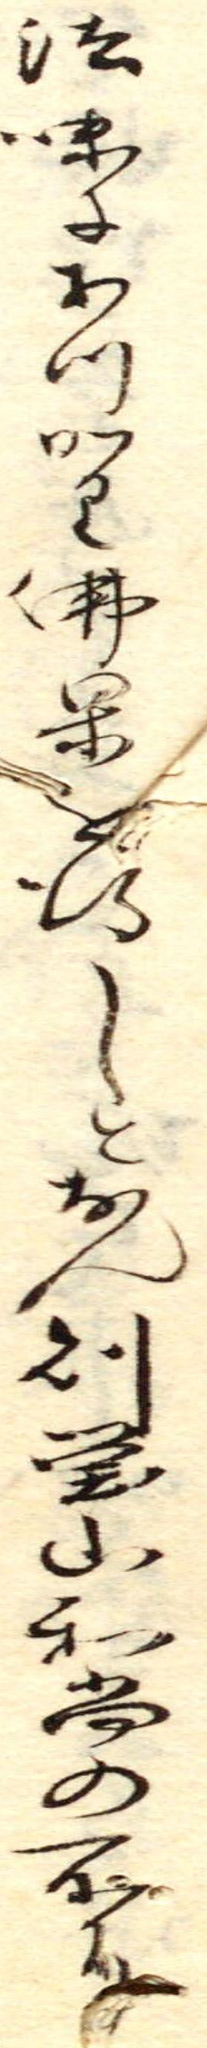法味にあつかり仏果を得しとなん則瑩山和尚の所に
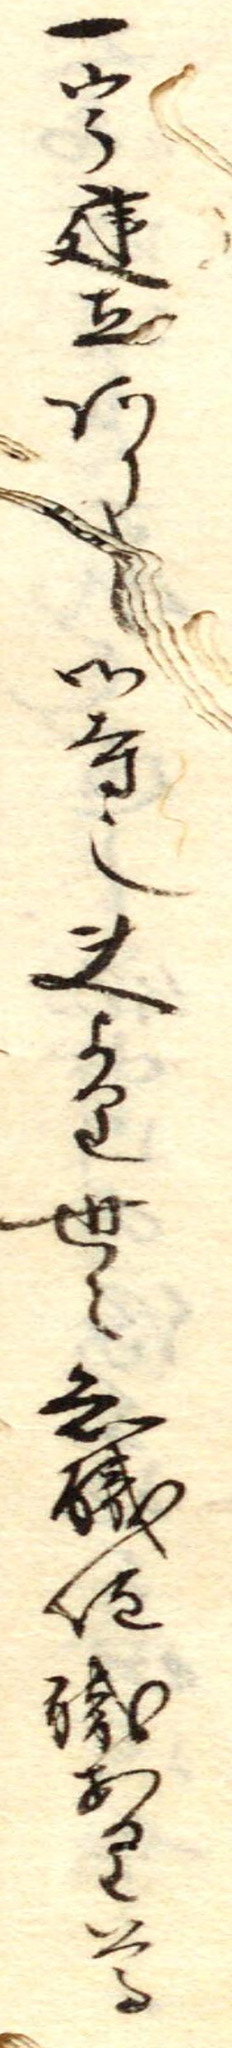一宇建立ありし御寺也夫より世々知識住職あり尊
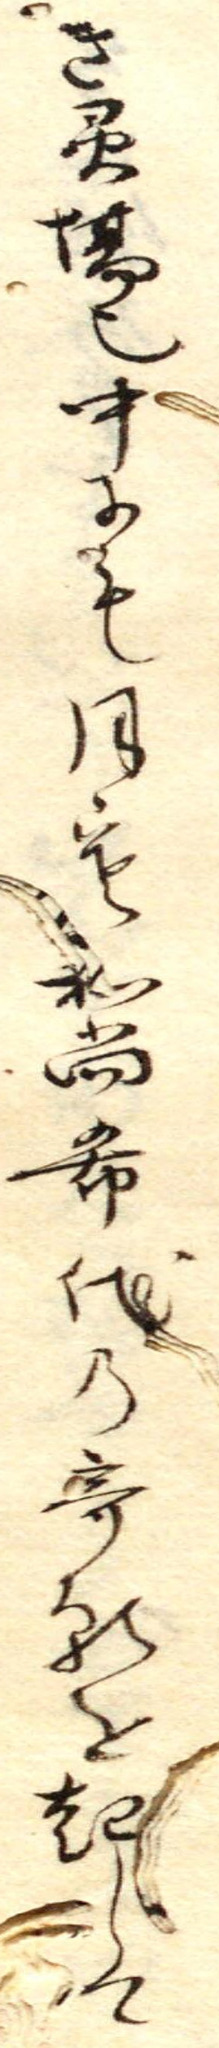き霊場也中にも月寒和尚稀代の奇願を起して
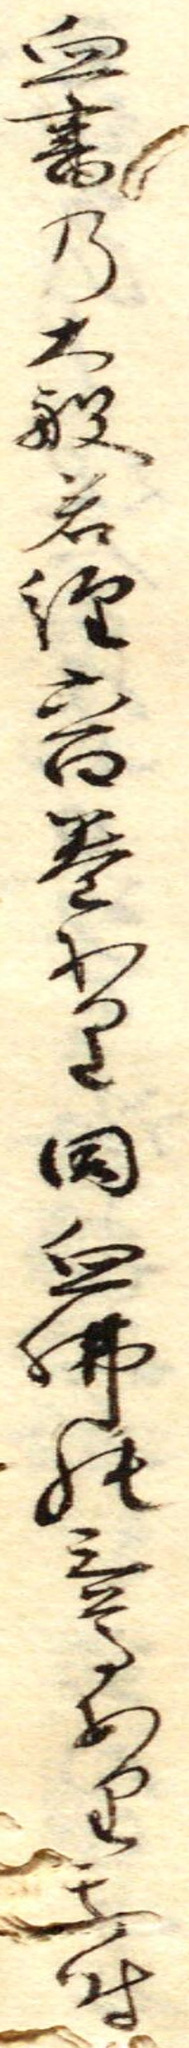血書の大般若経六百巻あり同血仏の三尊あり其時

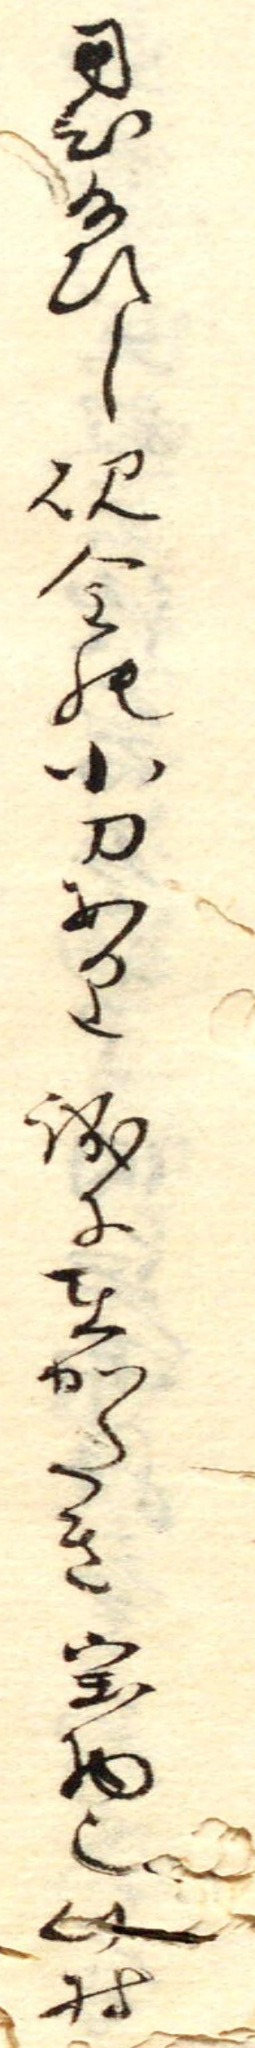用ひ給ひし硯金の小刀あり誠に在かたき宝物也此村
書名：能登名跡誌
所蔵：Ishikawa Prefectural Library
